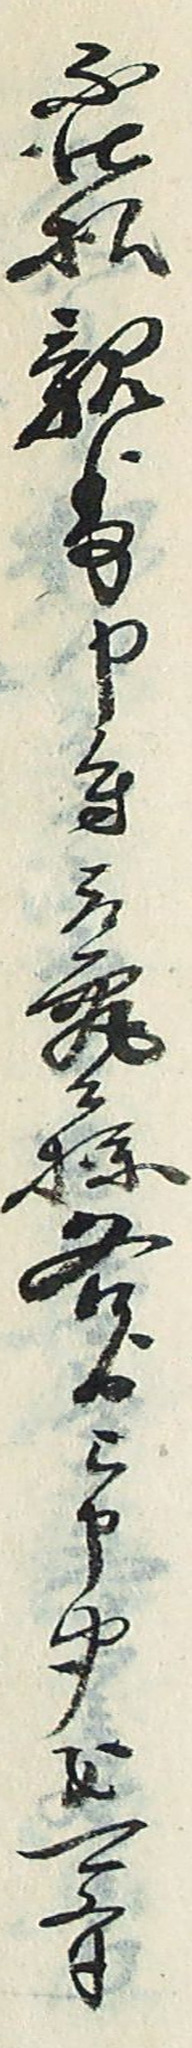不仕様親布申付取究候様各ゟ被申聞義可有
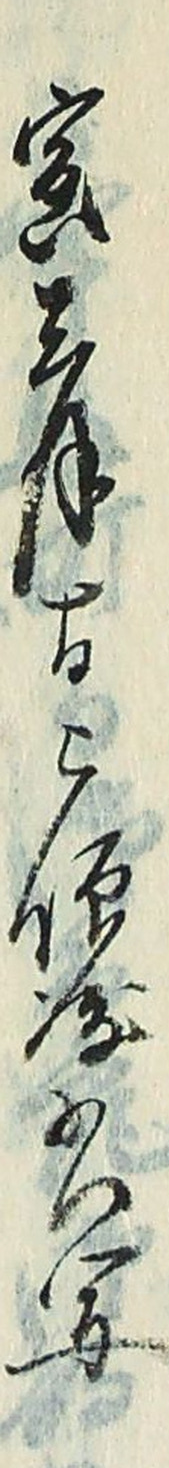寅十二月十日被仰渡書写
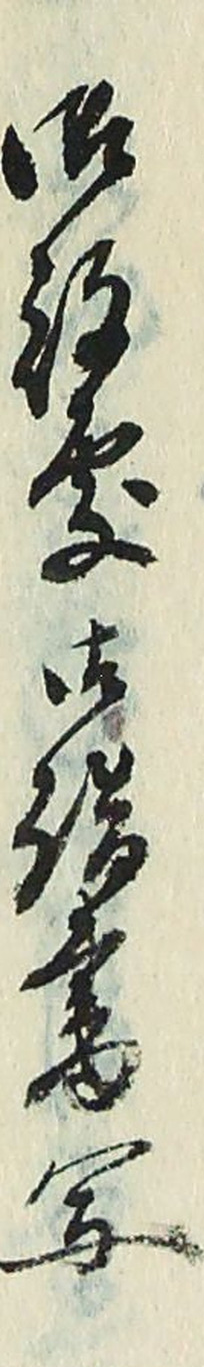御役處御端書写
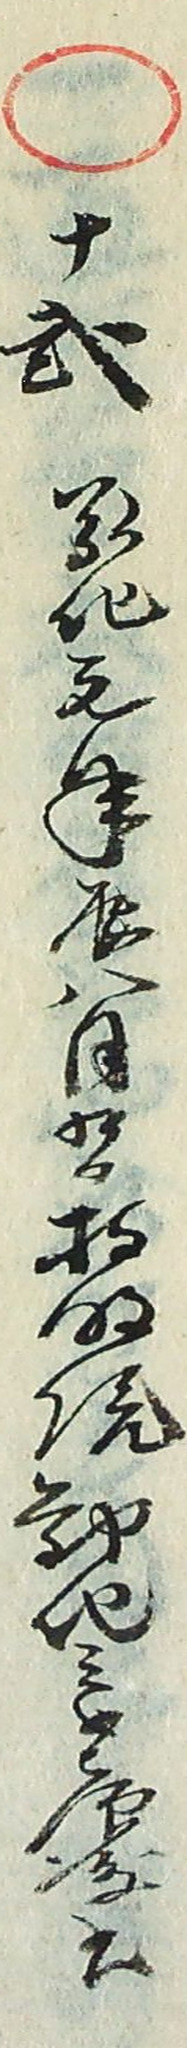○十弐弘化元年辰八月九日持明院勧化之義被仰渡書
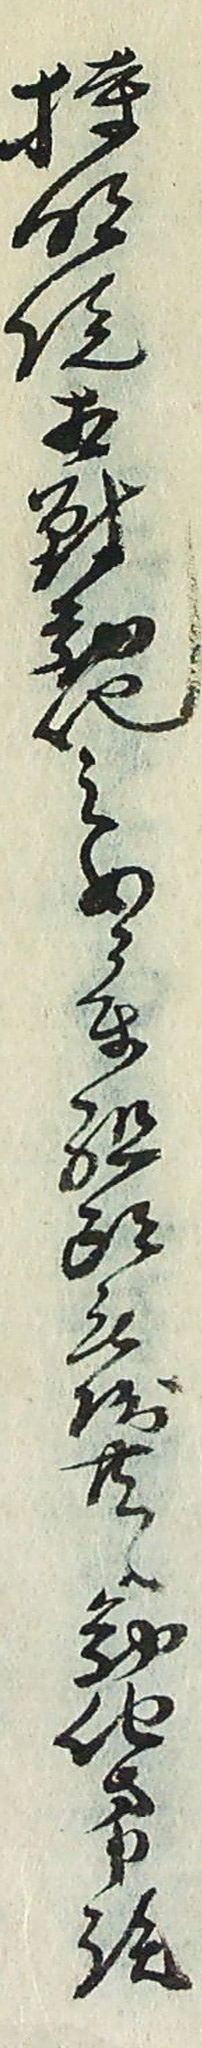持明院相對勧化之義ニ付組頭庄屋共へ勧化方申談
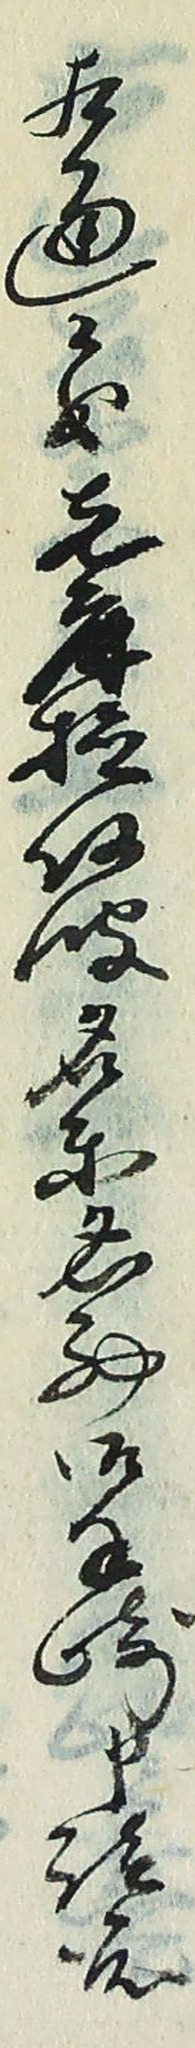左通之義先麻植阿波名東名西御手崎申談候所ヵ
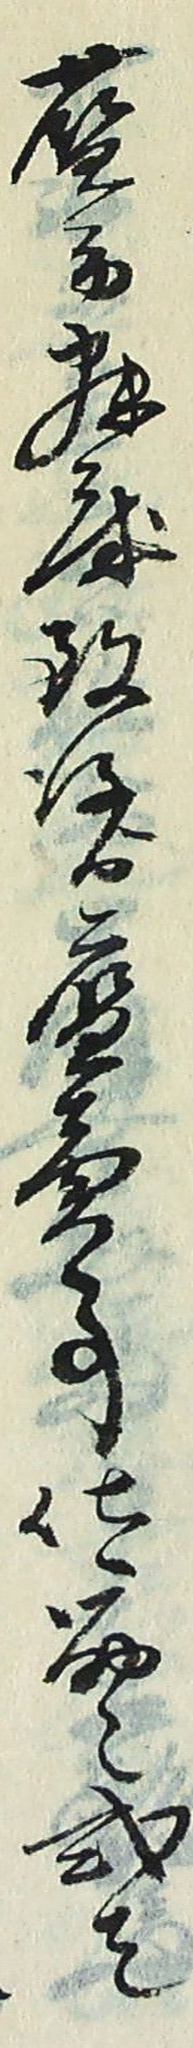藍方寐床改役ゟ藍賣事仕候筋々或者
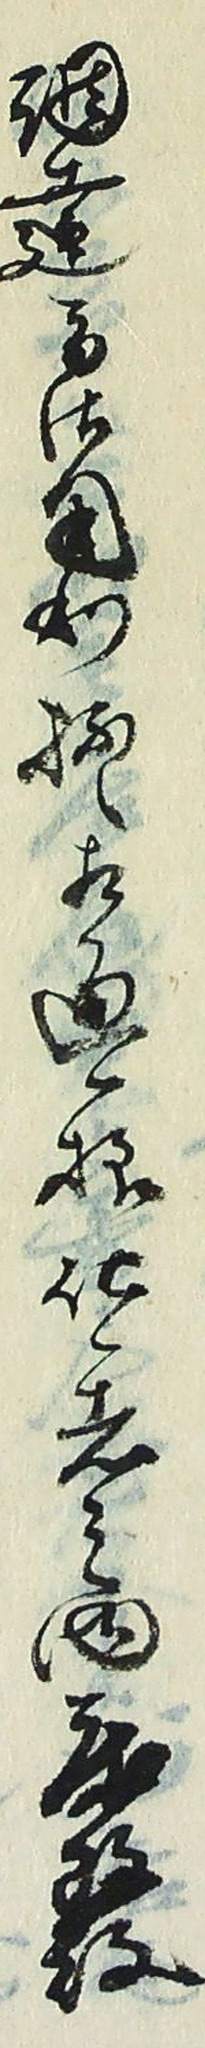調達方御用判抔へ相通候様仕候者之内床改役
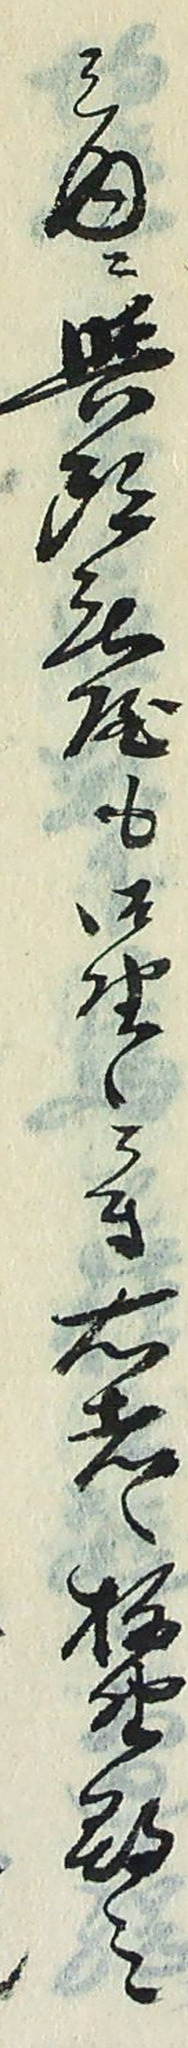之内ニ與頭庄屋も御坐候ニ付右者へ板野郡之
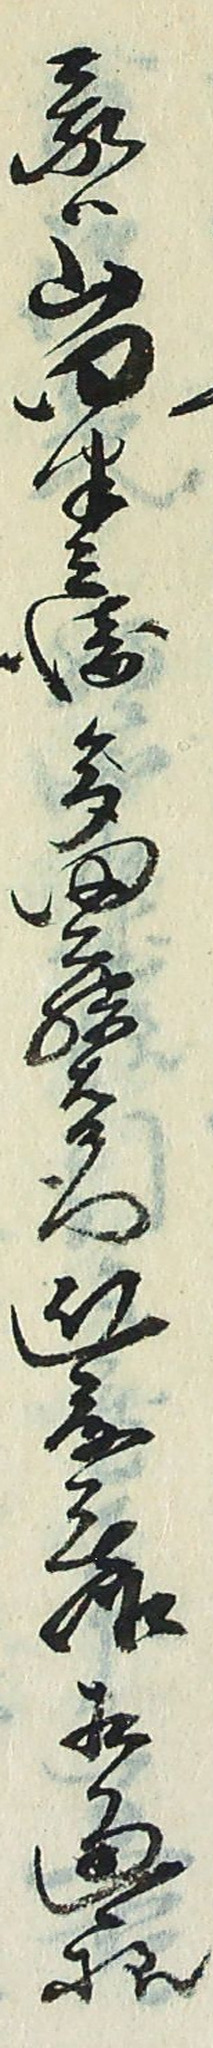義ハ山田半兵衛多田藤右衛門近藤庄作相通候様
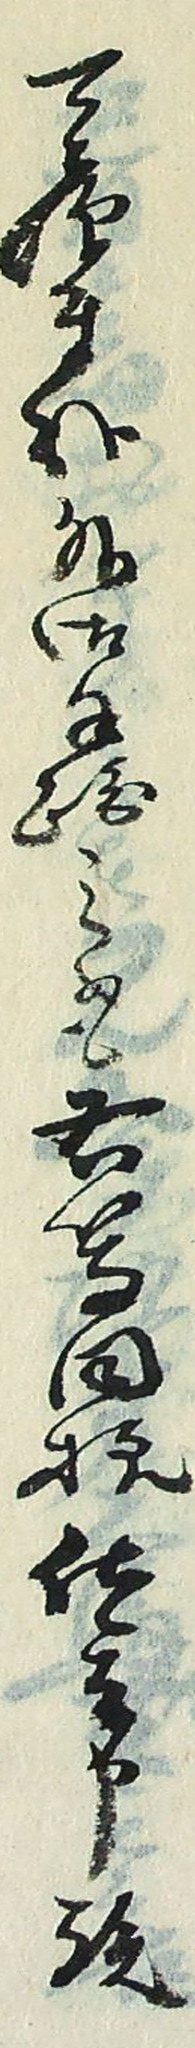可被仰付哉外御手崎之義も右等同様仕候旨申談
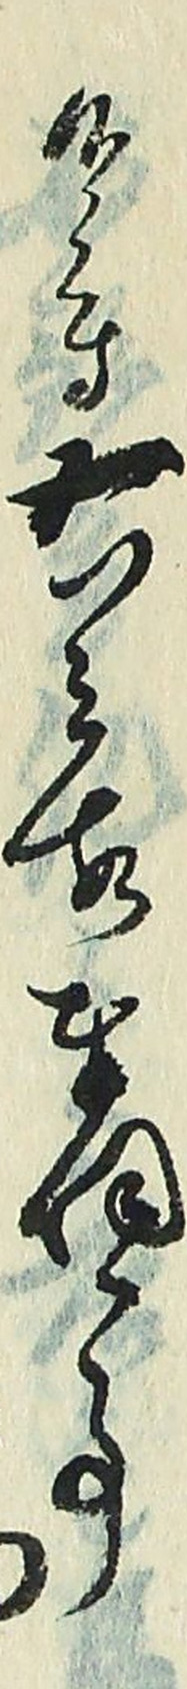候ニ付右之段奉伺候事
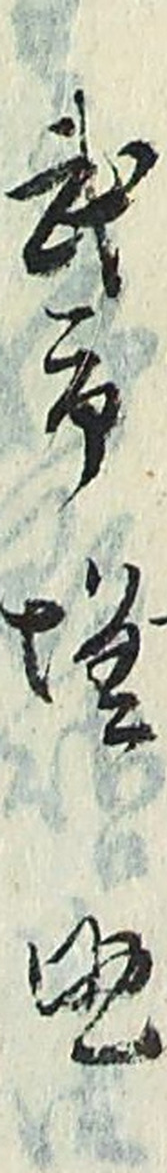武市増助
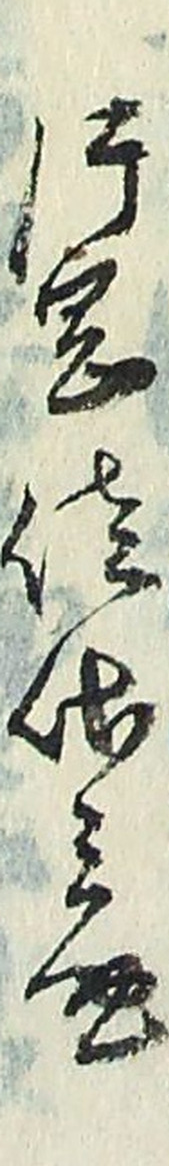片岡佐代之助
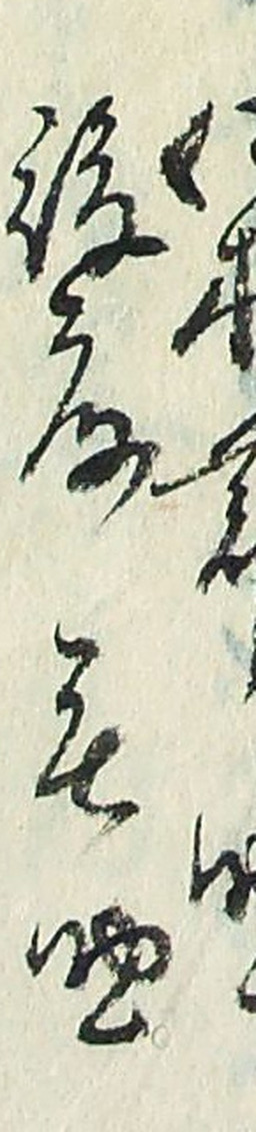後藤庄助
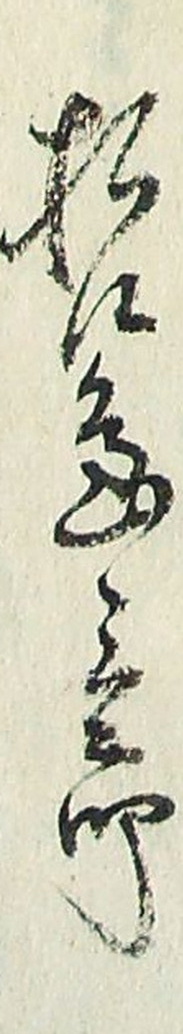松江島三郎
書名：諸御趣意書并御下知向之写
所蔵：鳴門教育大学 Naruto University of Education
